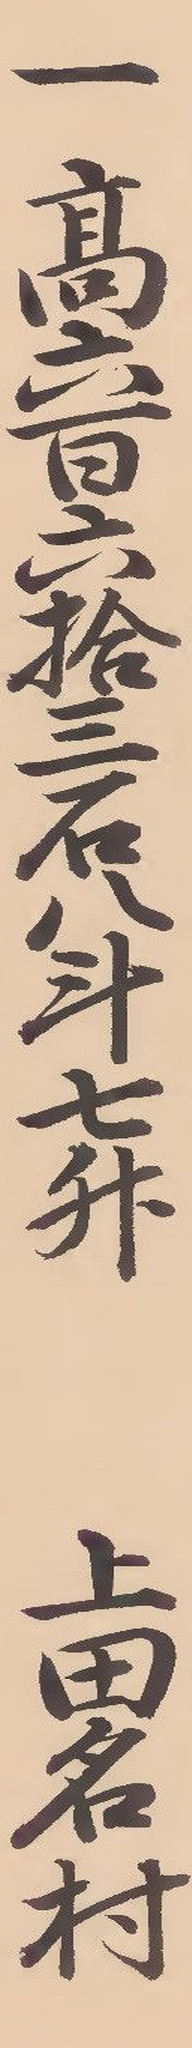一高六百六拾三石八斗七升上田名村

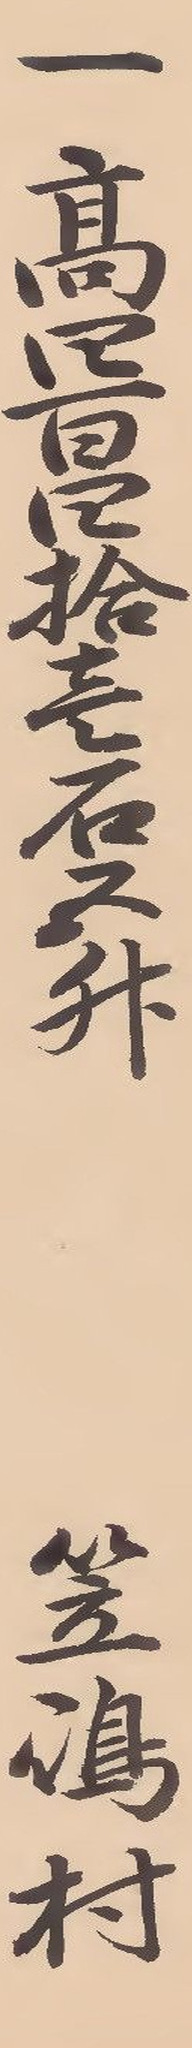一高四百四拾壱石五升笠島村
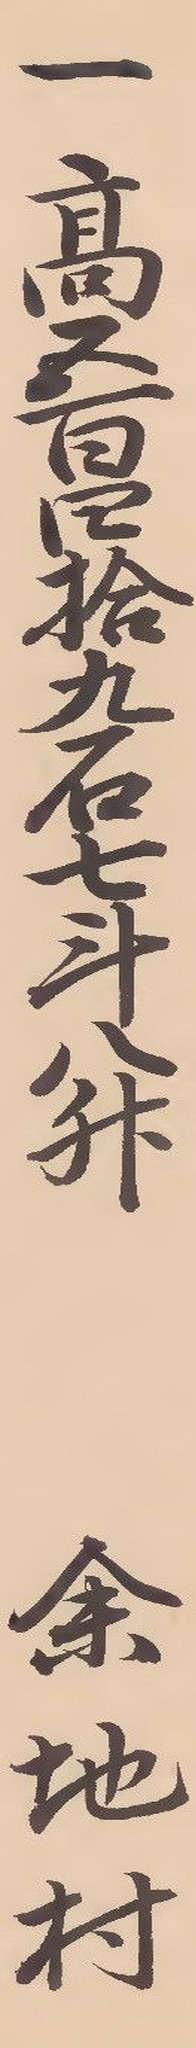一高五百四拾九石七斗八升余地村
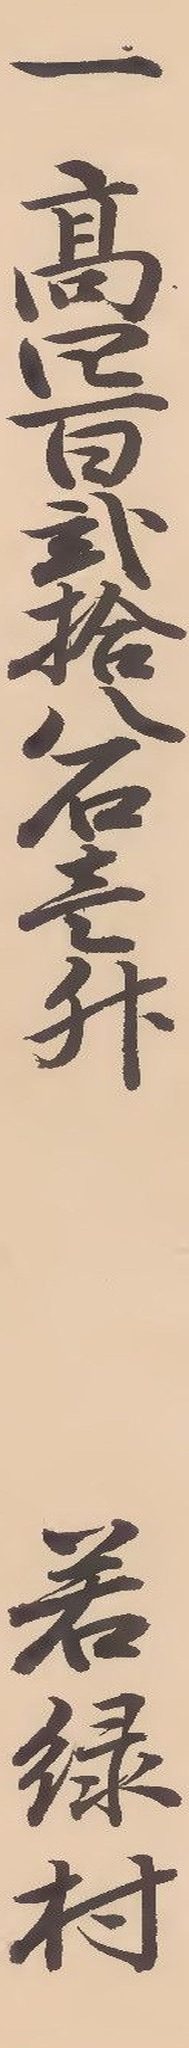一高四百弐拾八石壱升若緑村
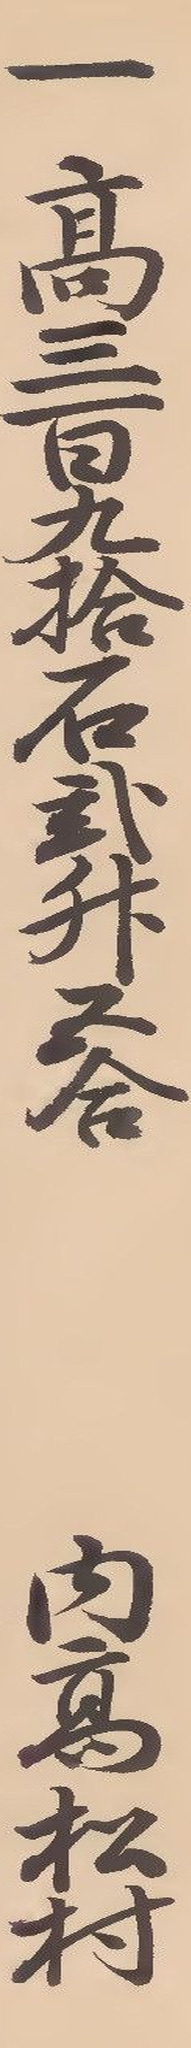一高三百九拾石弐升五合内高松村
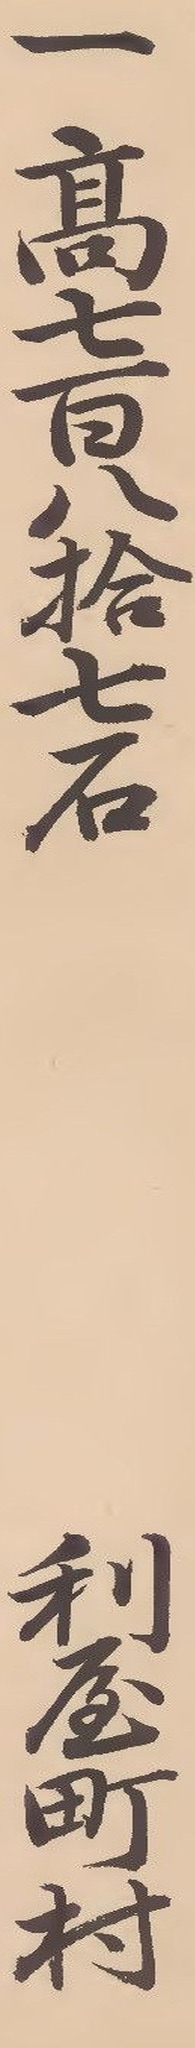一高七百八拾七石利屋町村
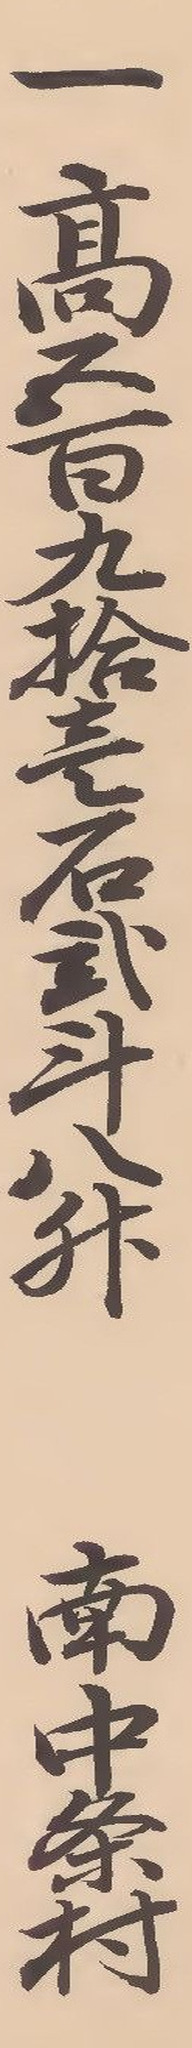一高五百九拾壱石弐斗八升南中条村
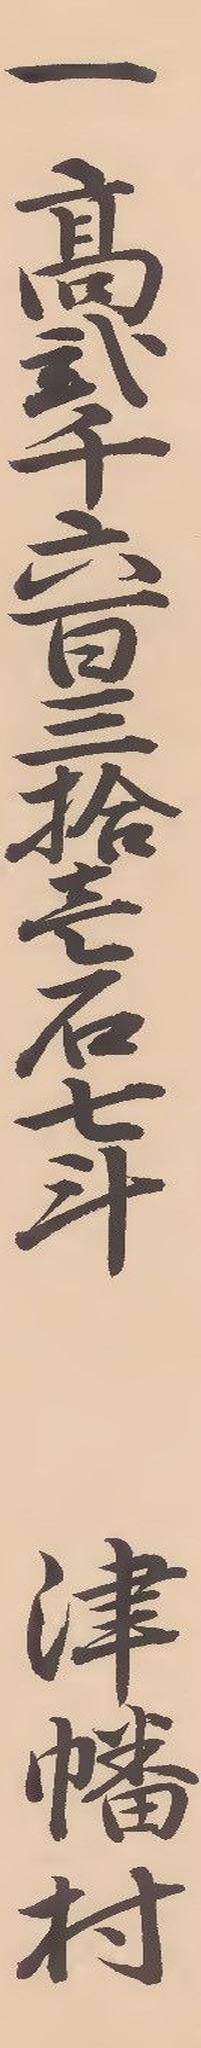一高弐千六百三拾壱石七斗津幡村

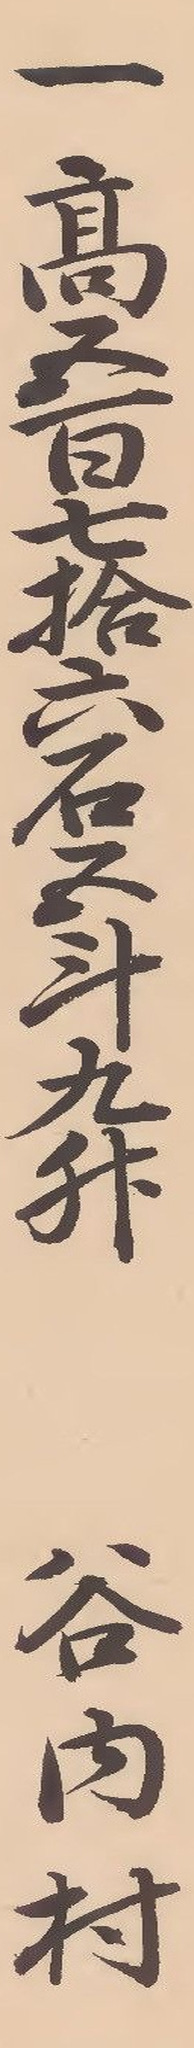一高五百七拾六石五斗九升谷内村
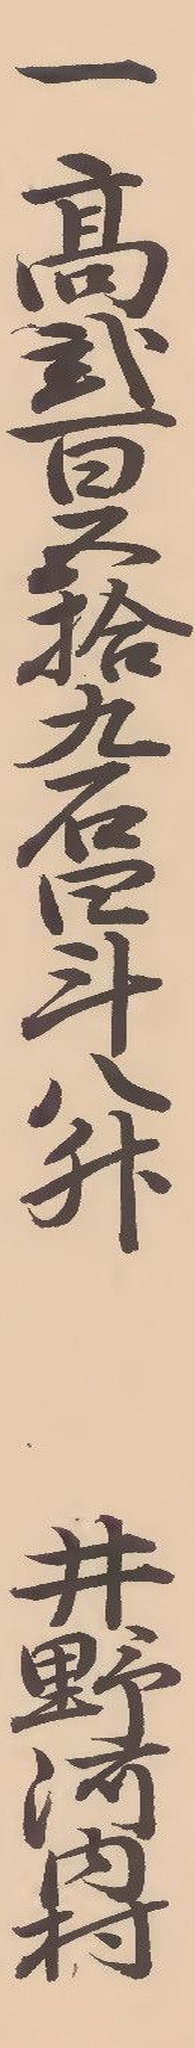一高弐百五拾九石四斗八升井野河内村
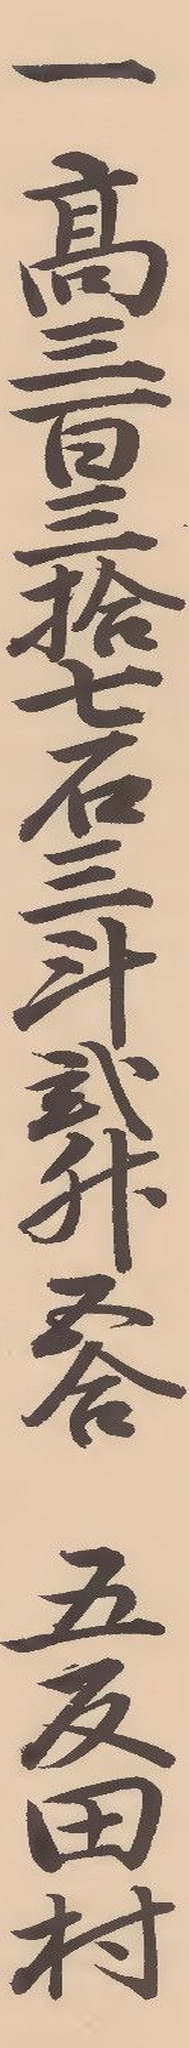一高三百三拾七石三斗弐升五合五反田村
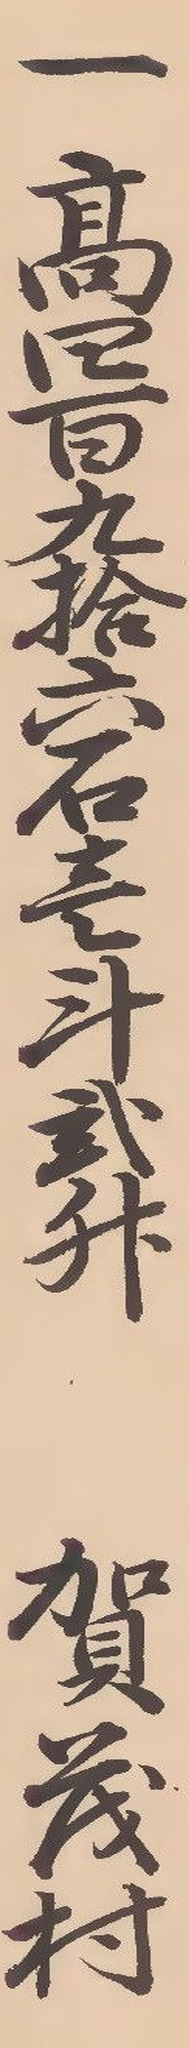一高四百九拾六石壱斗弐升賀茂村
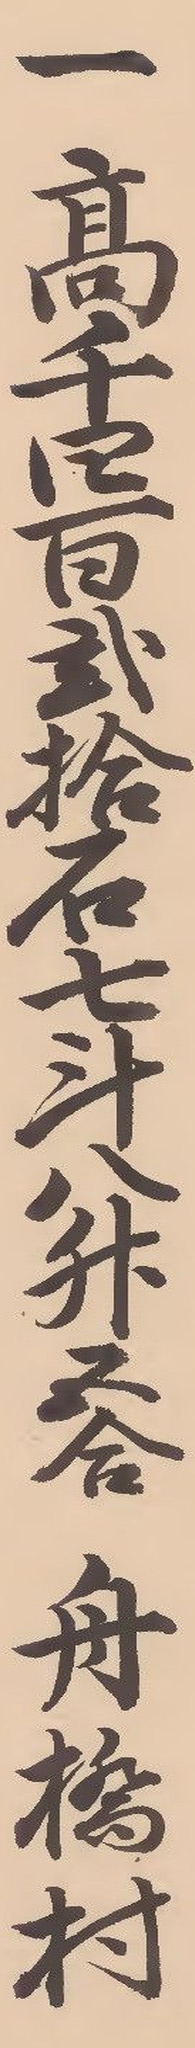一高千四百弐拾石七斗八升五合舟橋村
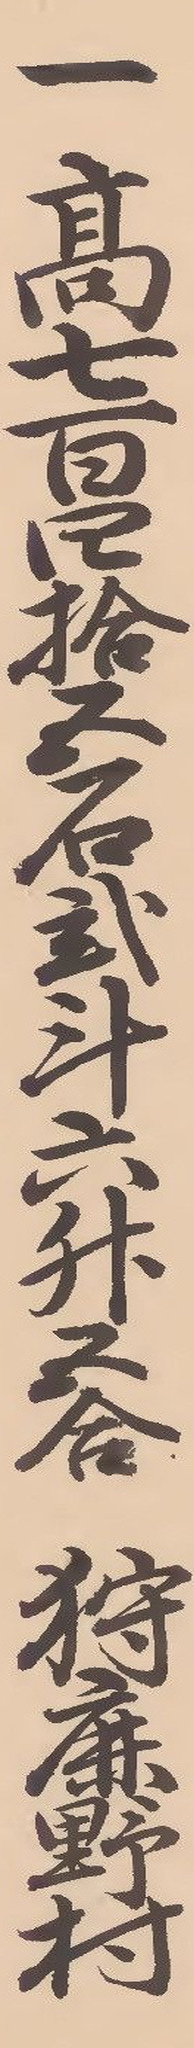一高七百四拾五石弐斗六升五合狩鹿野村

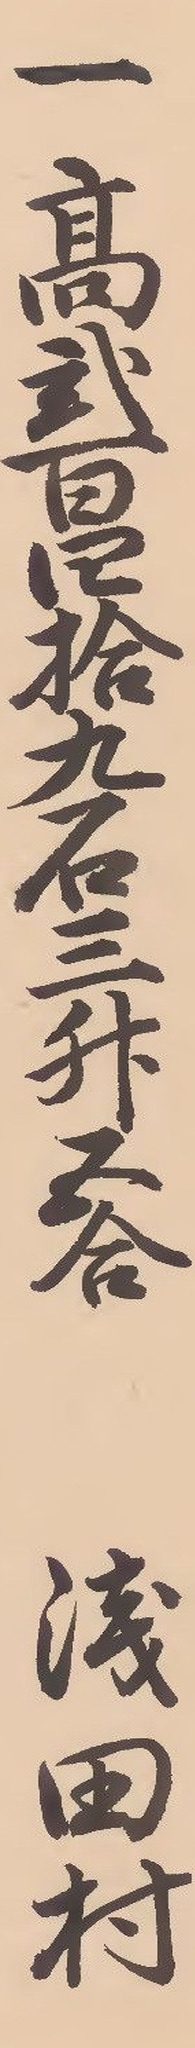一高弐百四拾九石三升五合浅田村
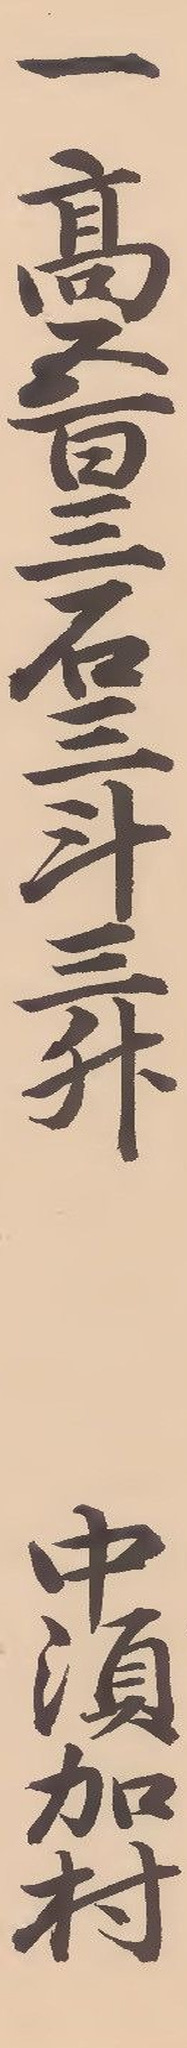一高五百三石三斗三升中須加村
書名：加賀国郷帳
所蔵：国立公文書館 National Archives of Japan
